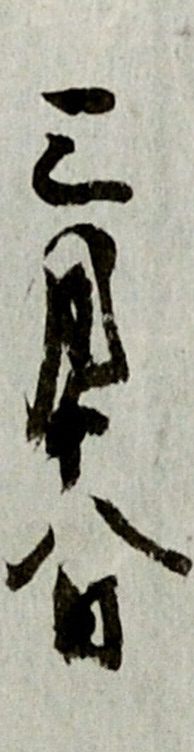三月十六日
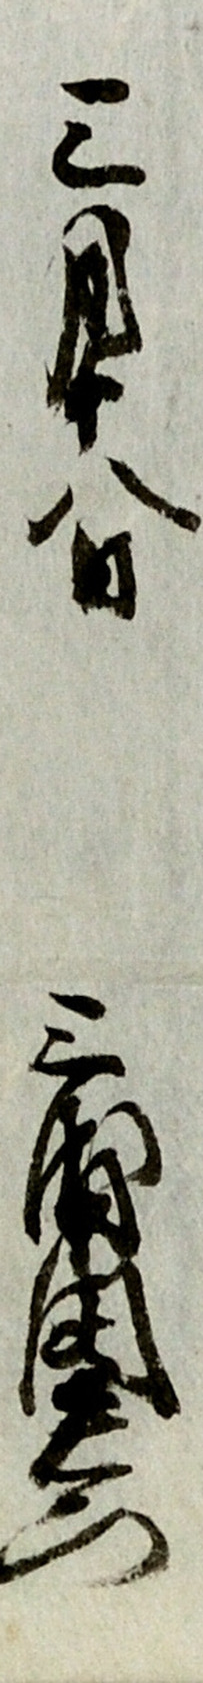三月十八日三浦団右衛門
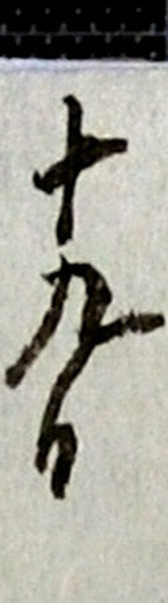十九日
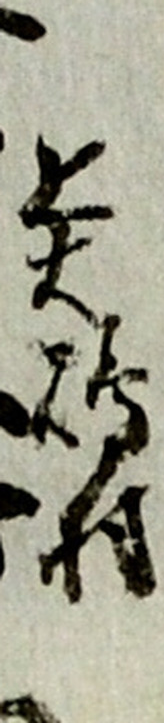上大嶋村
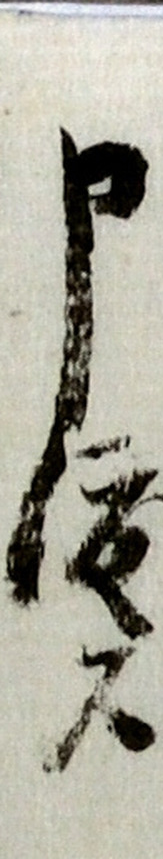申渡ス

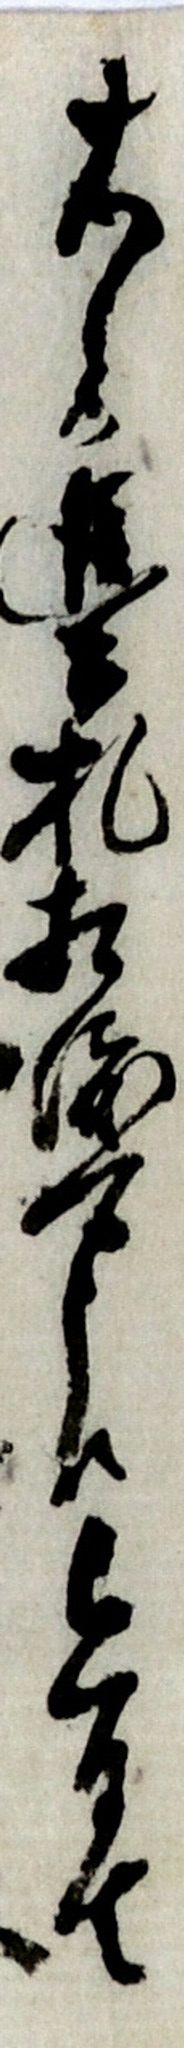右は追而札相渡可申候今日は
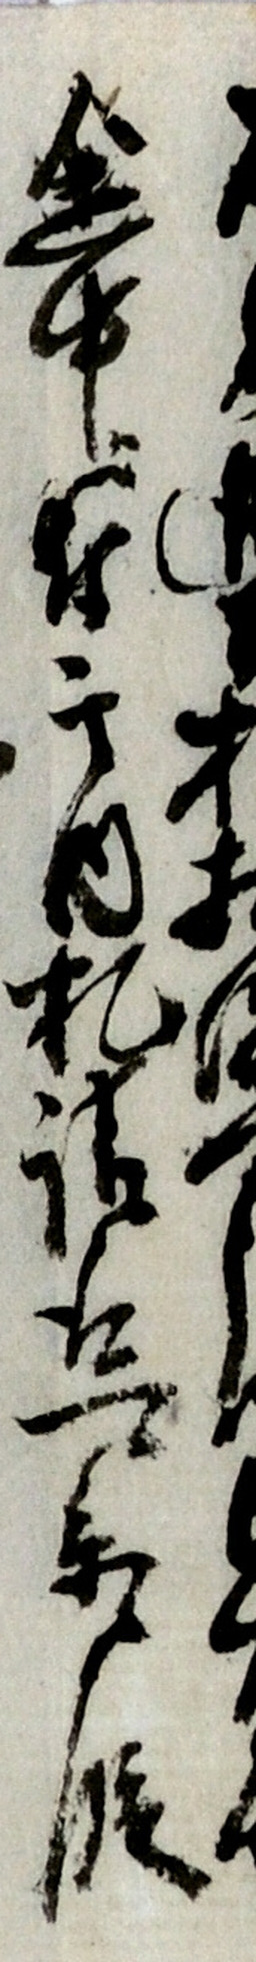途中ニ付其内札請取可参候段
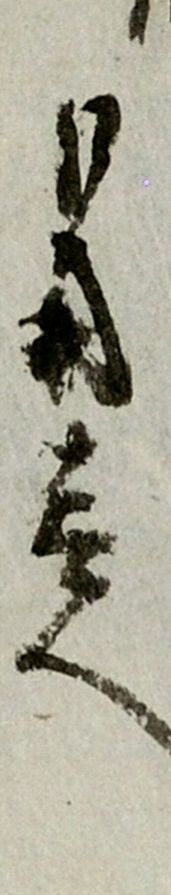御用壱人
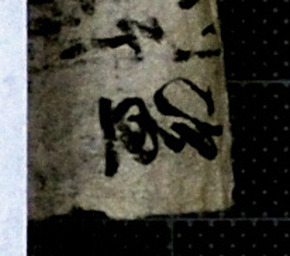廿一日
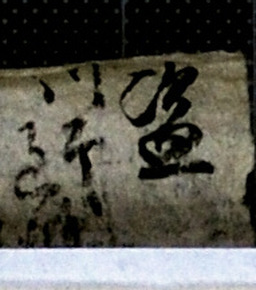廿一日
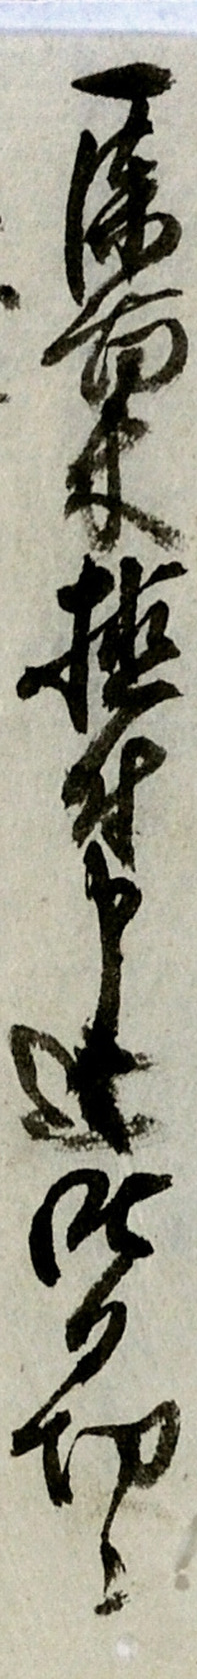一漆苗木植付申達昨日切に
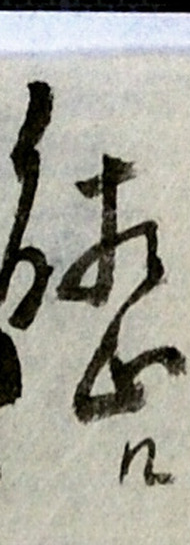相止候
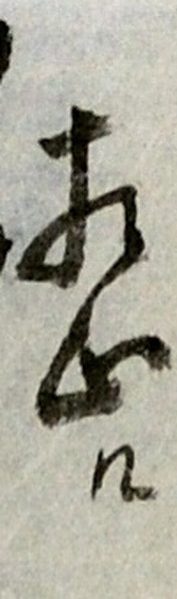相止候
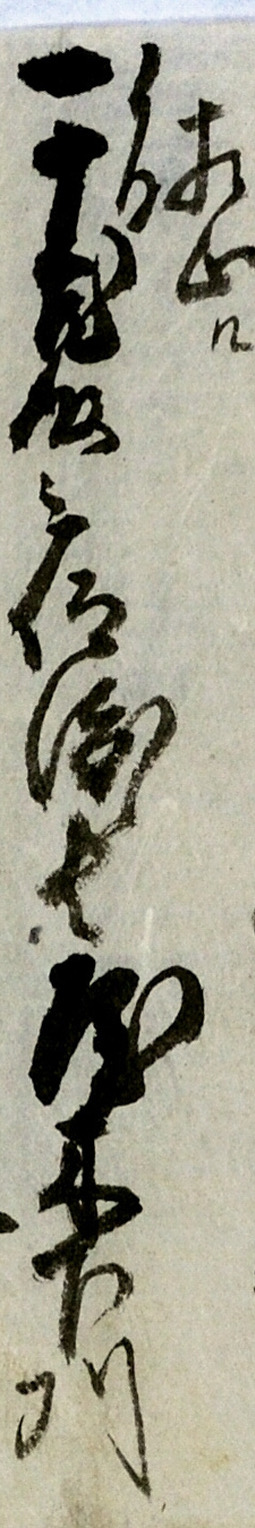一十蔵殿ニ仰渡候者屋木下川
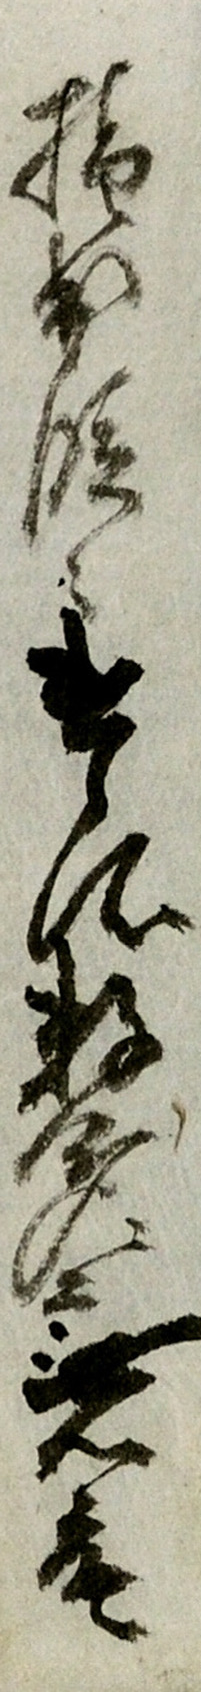指出段々遣候所数多ニ而無之
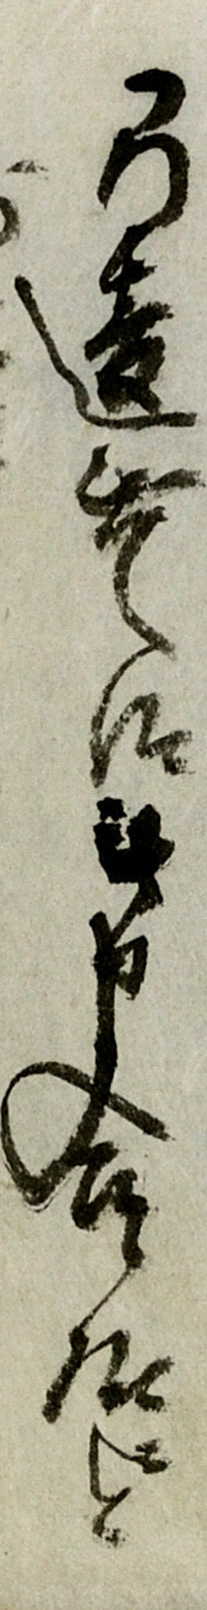間違無之様被申合候様ニと
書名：分一方諸事御用留帳
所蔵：伊那市立高遠町図書館・合同会社AMANE
